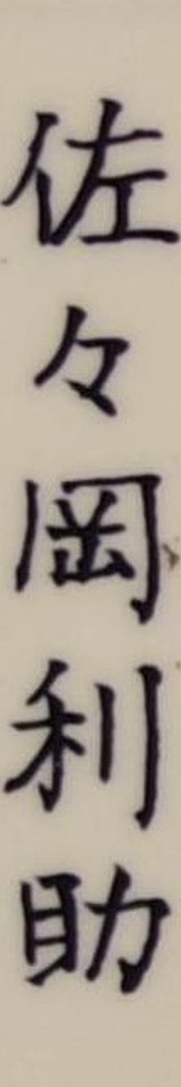佐々岡利助
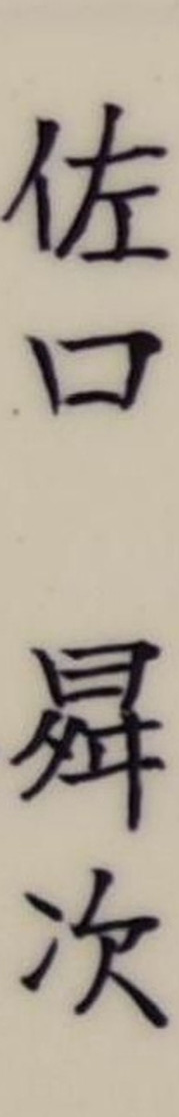佐口昇次
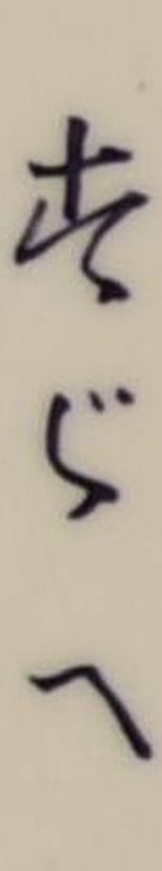すずへ
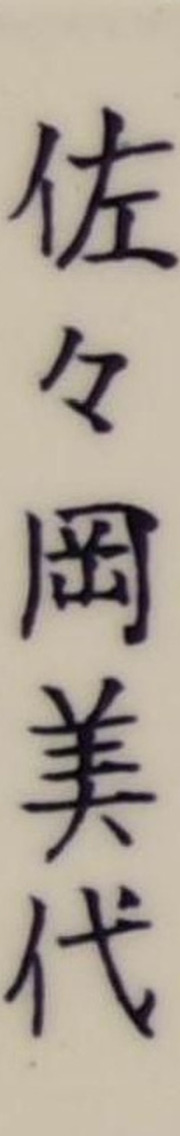佐々岡美代
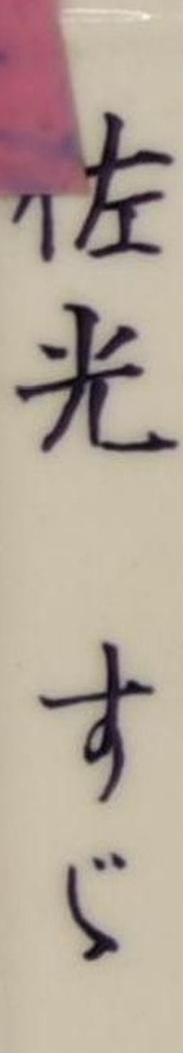佐光すず

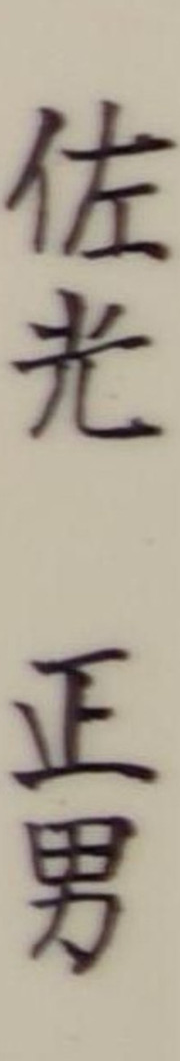佐光正男
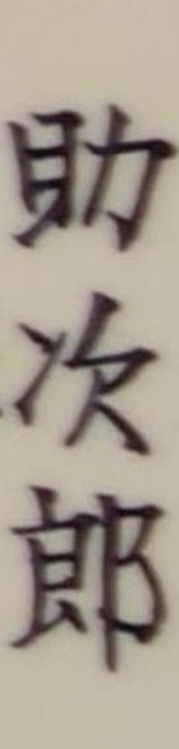助次郎
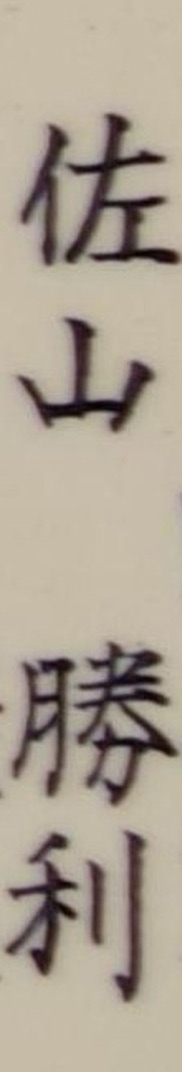佐山勝利
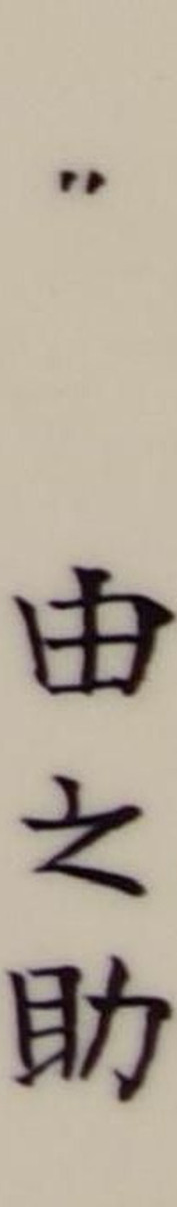由之助
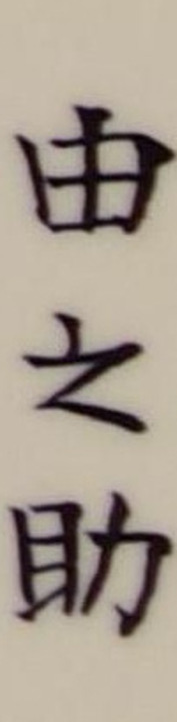由之助
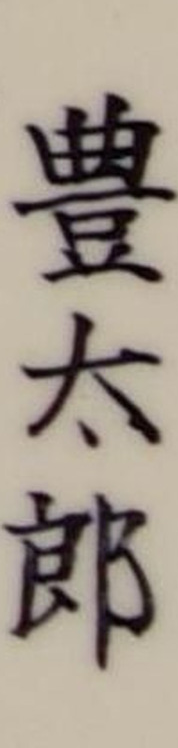豊太郎
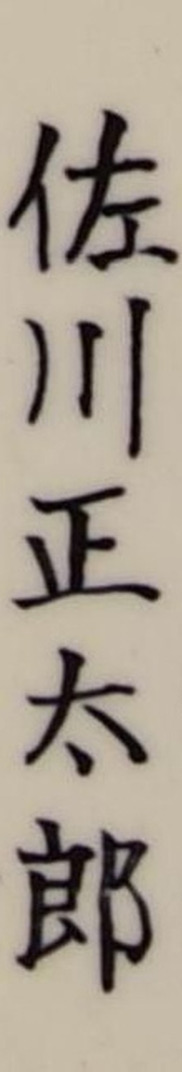佐川正太郎
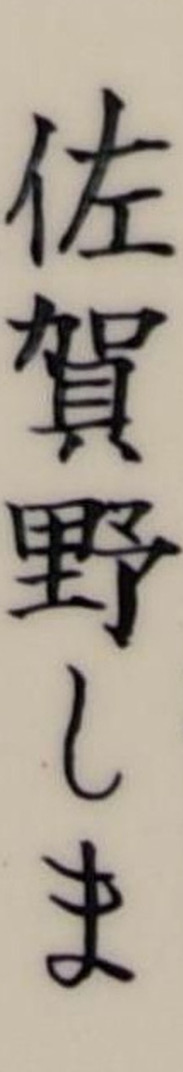佐賀野しま
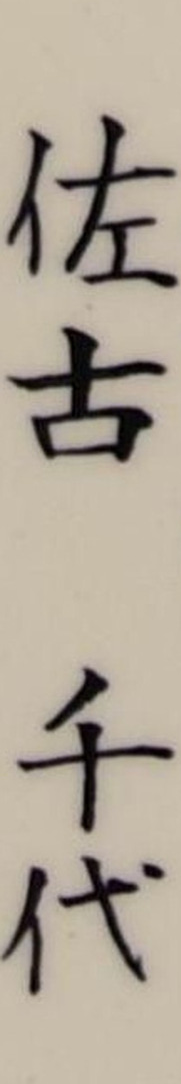佐古千代
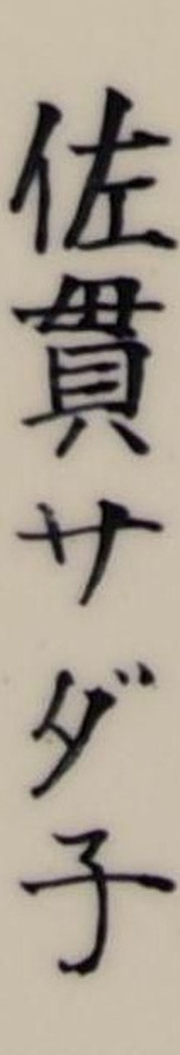佐貫サダ子
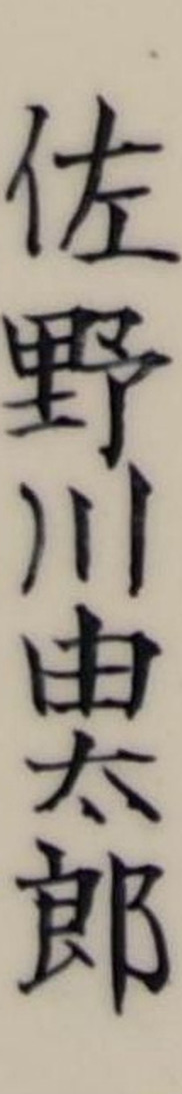佐野川由太郎
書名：E~L
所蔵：高野山金剛峯寺
